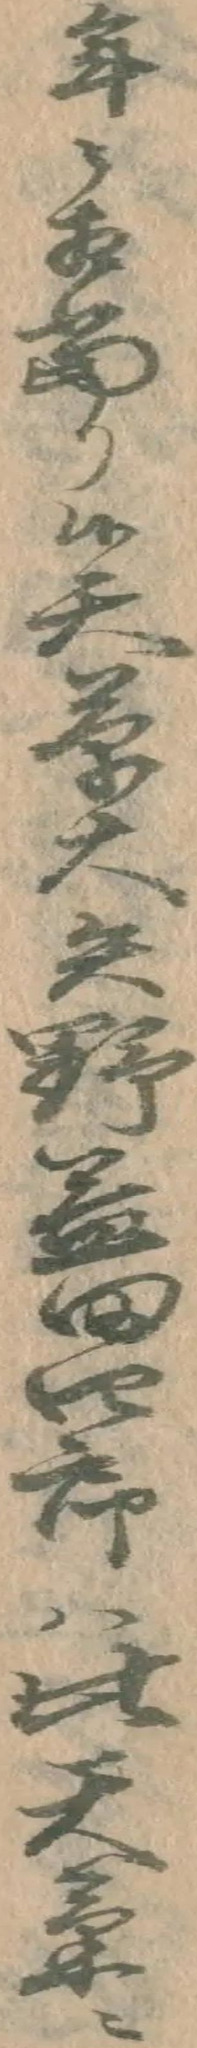年に相当り候天草大矢野益田四郎は比天気に
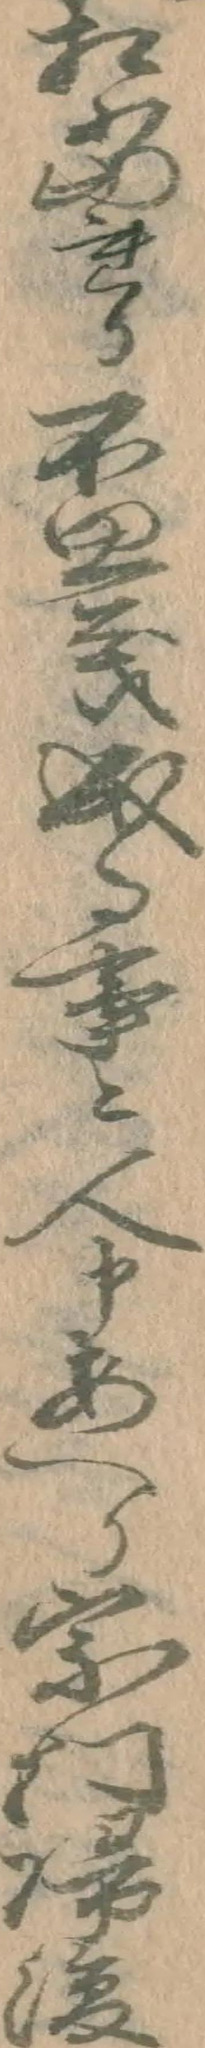相当れり不思義成る事と人申あへり宗門帰復
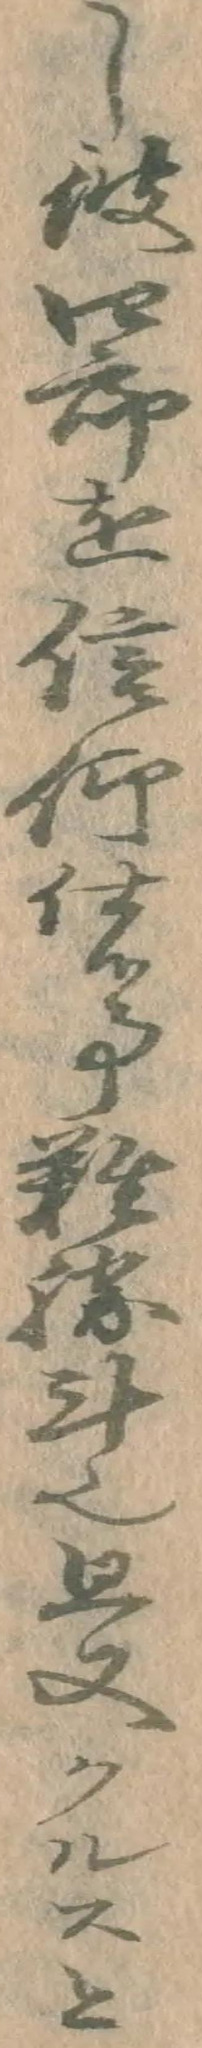し彼四郎を信仰仕候事難勝斗也旦又クルスと
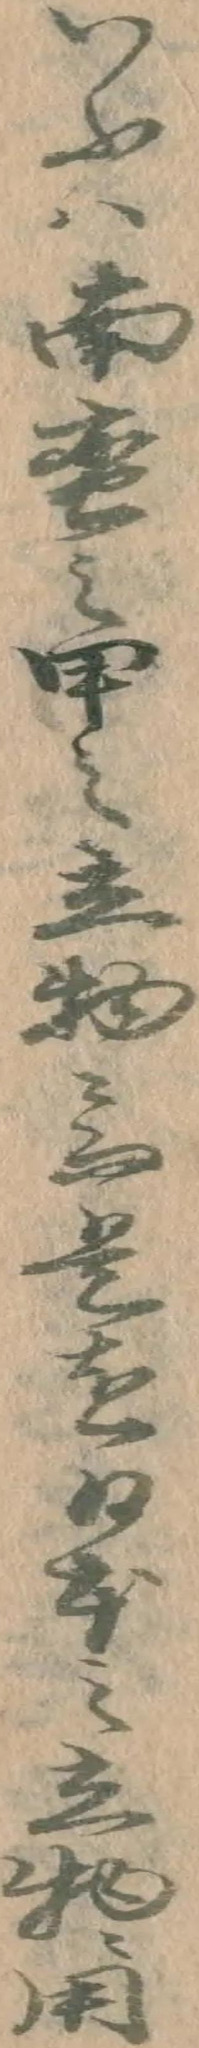いふは南蛮之甲之立物に而是を日本之立物に用
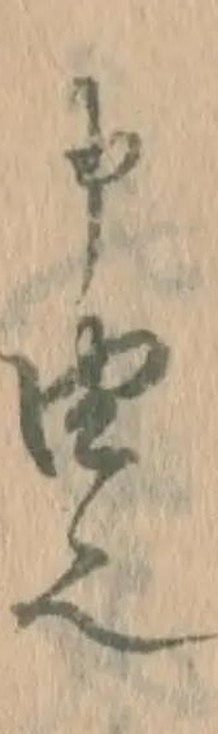申由也
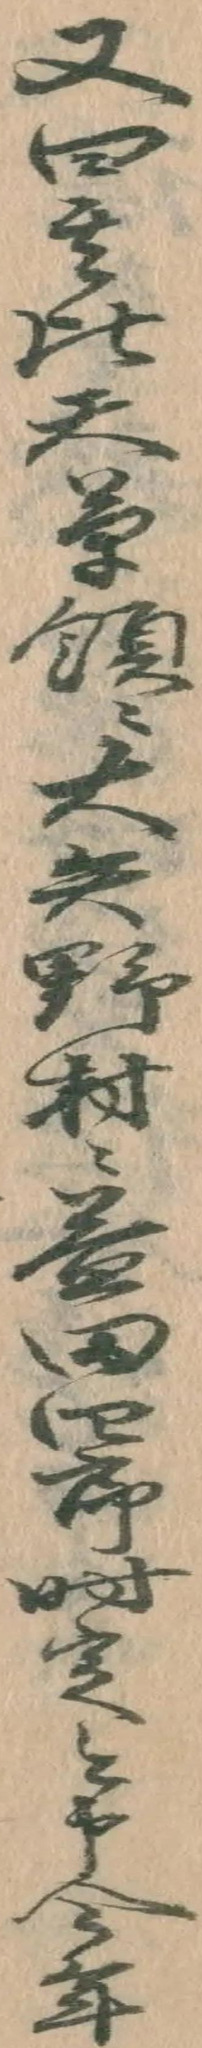又日其比天草領に大矢野村に益田四郎時定と申今年
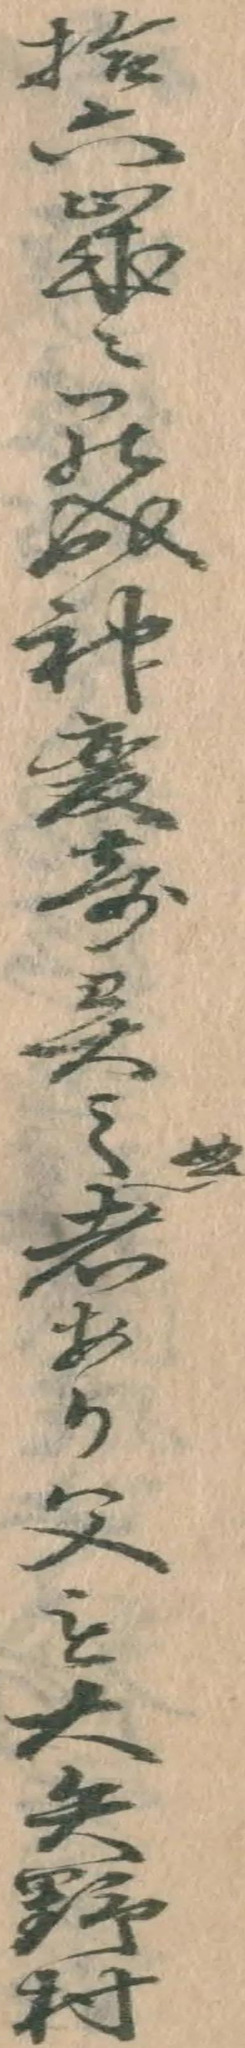拾六歳に罷成神変奇異之曲者あり父も大矢野村
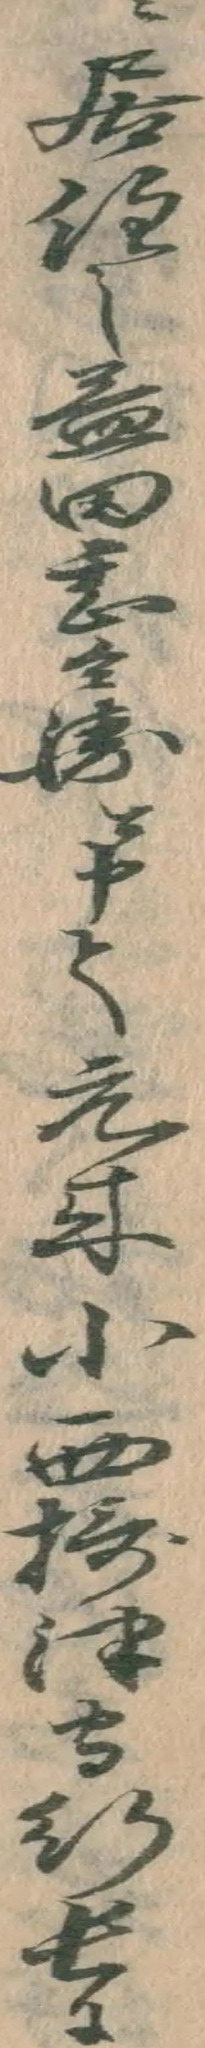に居住し益田甚兵衛と申て元来小西摂津守行長に
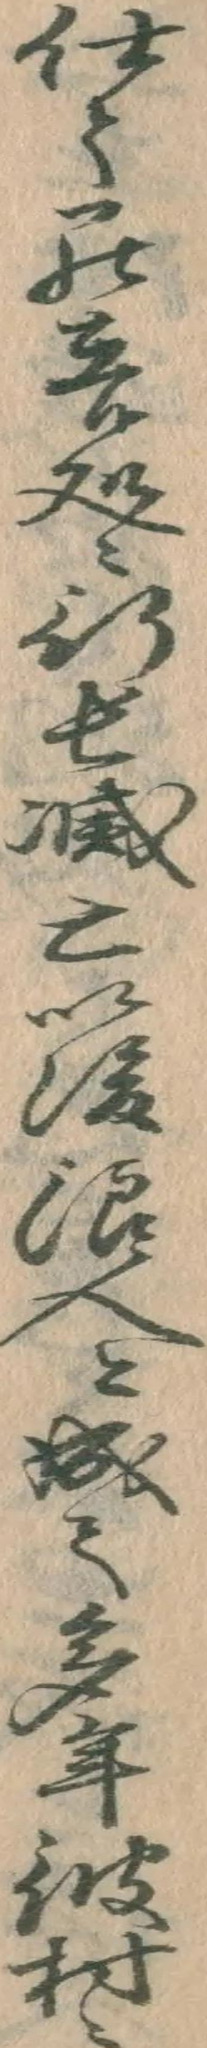仕て罷在候処に行長滅亡以後浪人と成て多年彼村に
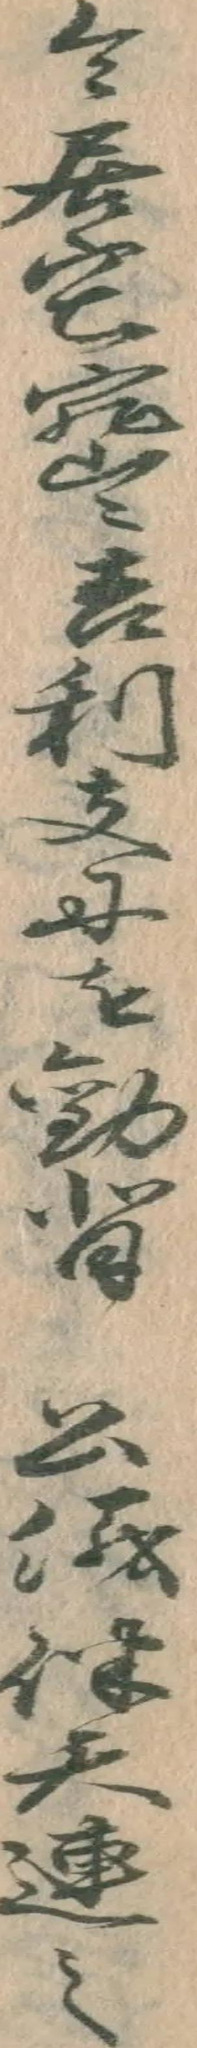令居宅密に吉利支丹を勧背公儀伴天連之
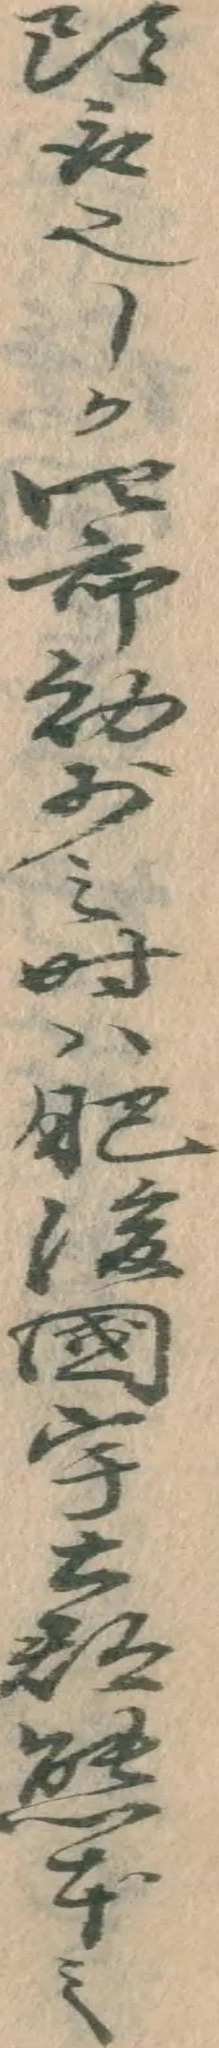頭取也しか四郎幼少之時は肥後国宇土郡熊本之
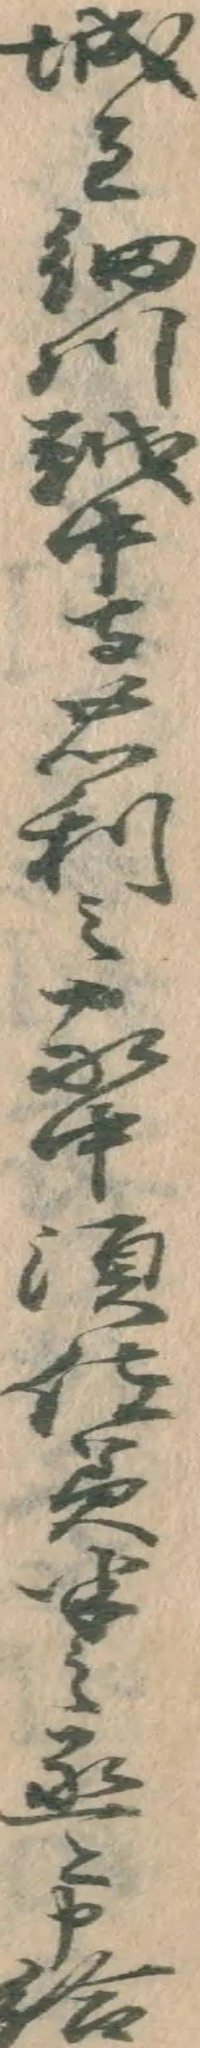城主細川越中守忠利之家中須佐美半之丞と申給
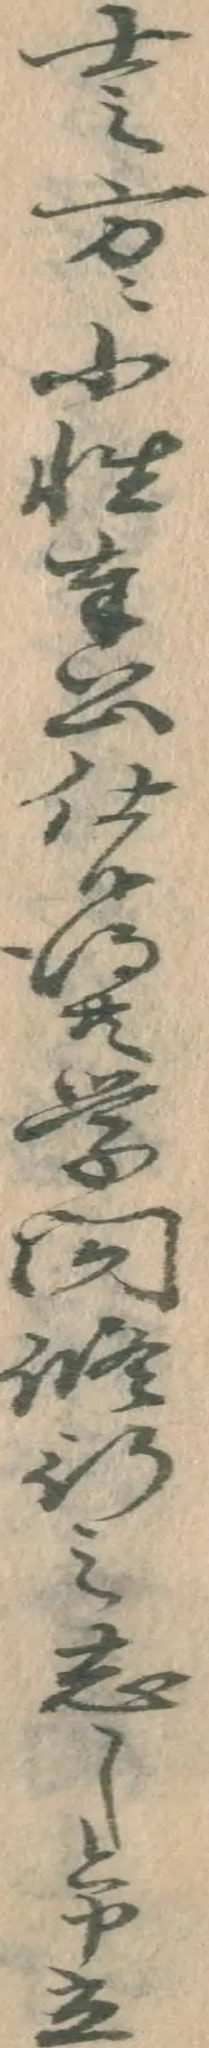士之方に小性奉公仕候得共学問修行之志しと申立
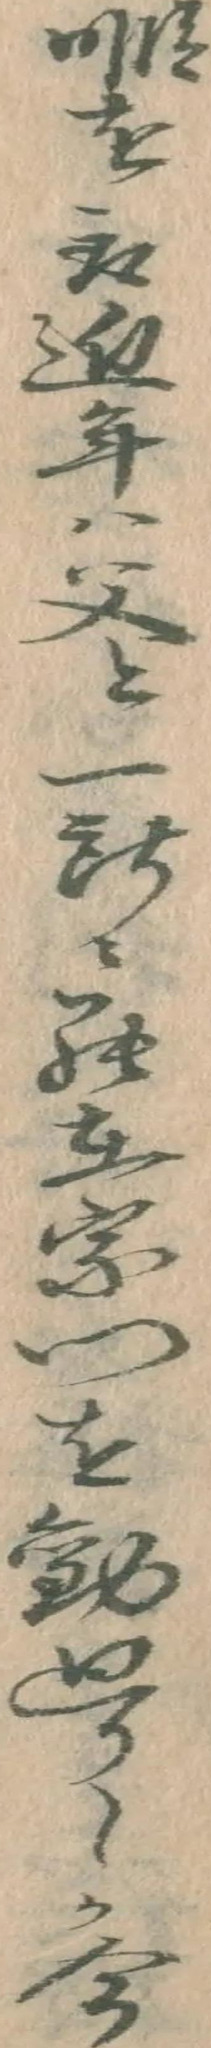暇を取近年は父と一所に能在宗門を勧廻りしか今
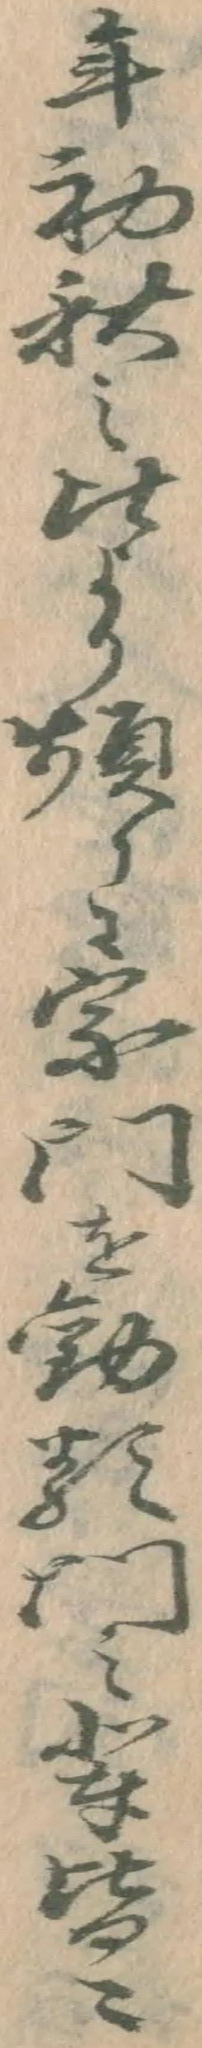年初秋之比より頻りに宗門を勧類門之輩皆々

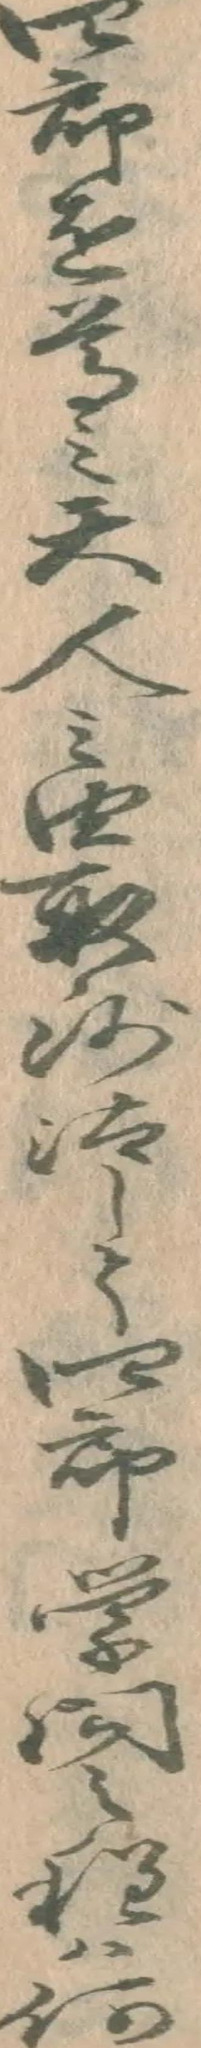四郎を尊み天人之由取沙汰して四郎学問之程は何
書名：切支丹御退治記 49巻. [1]
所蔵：国立国会図書館 National Diet Library, JAPAN
